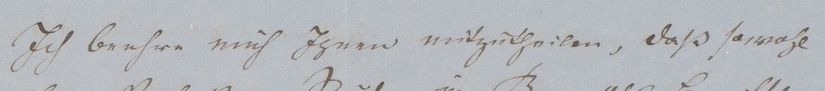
Ich beehre mich Ihnen mitzutheilen, daß sowohl
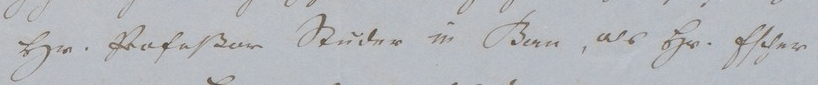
Hr. Profeßor Studer in Bern, als Hr. Escher
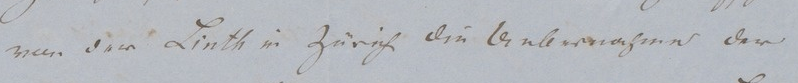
von der Linth in Zürich die Uebernahme der
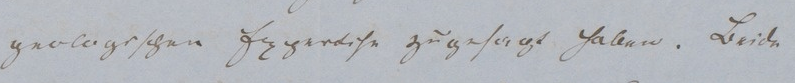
geologischen Expertise zugesagt haben. Beide
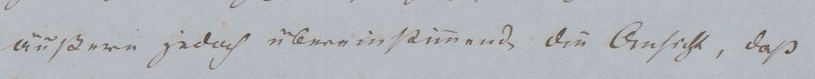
äußern jedoch übereinstimmend die Ansicht, daß
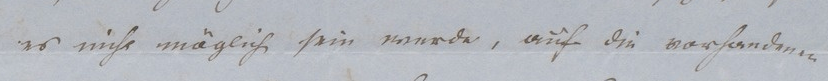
es nicht möglich sein werde, auf die vorhandenen
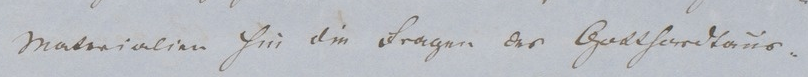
Materialien hin die Fragen des Gotthardtaus-
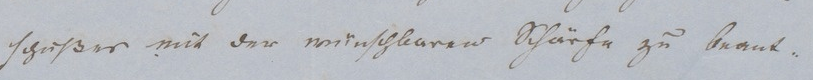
schußes mit der wünschbaren Schärfe zu beant-
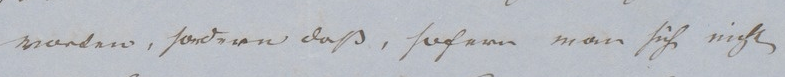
worten, sondern daß, sofern man sich nicht
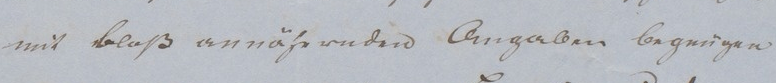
mit bloß annäherenden Angaben begnügen
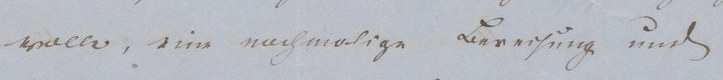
wolle, eine nochmalige Bereisung und
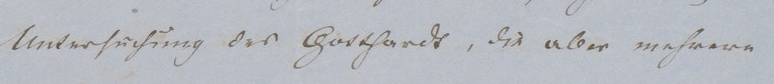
Untersuchung des Gotthardt, die aber mehrere
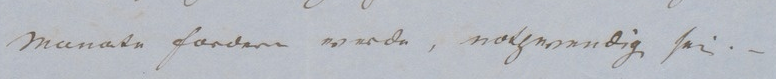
Monate fordern werde, nothwendig sei. –
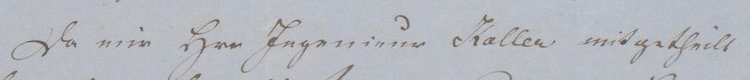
Da mir Hrr Ingenieur Koller mitgetheilt
